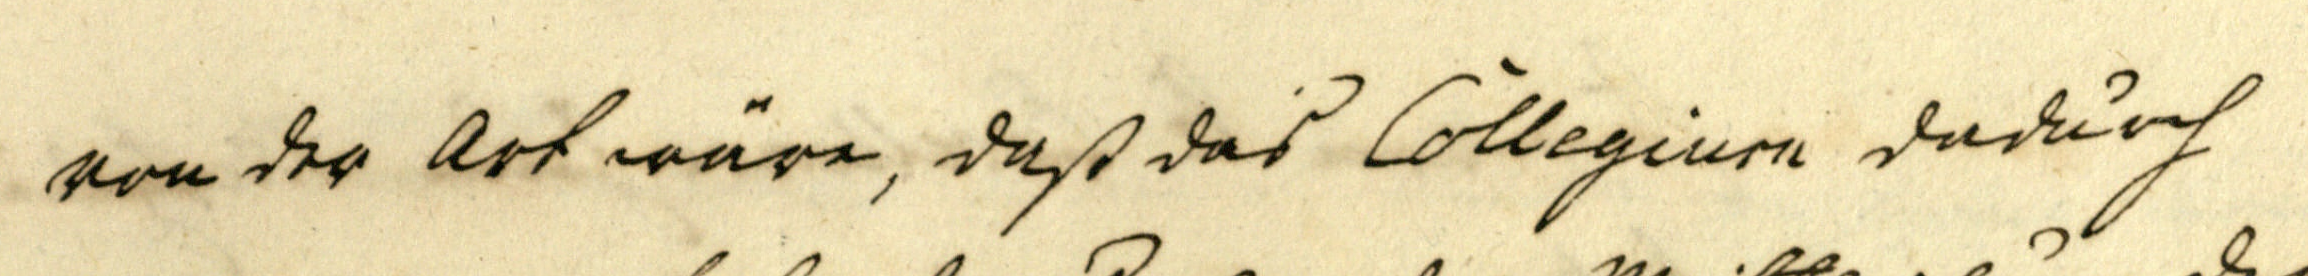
von der Art wäre, daß das Collegium dadurch
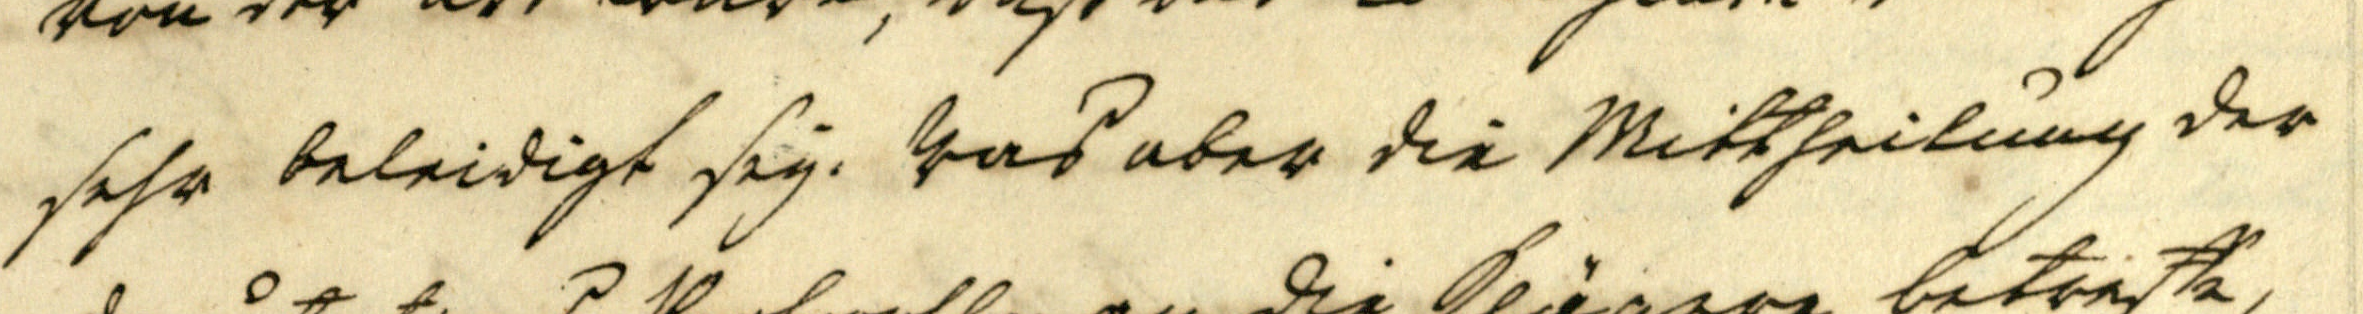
sehr beleidigt seÿ. Was aber die Mittheilung der
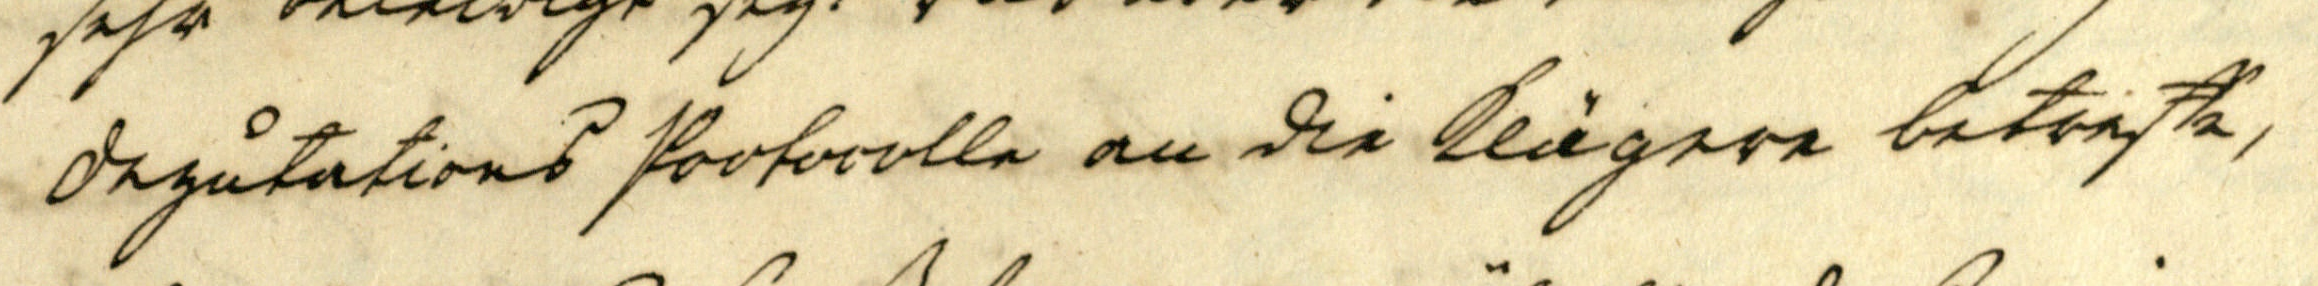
Deputations Protocolle an die Klägern betreffe,
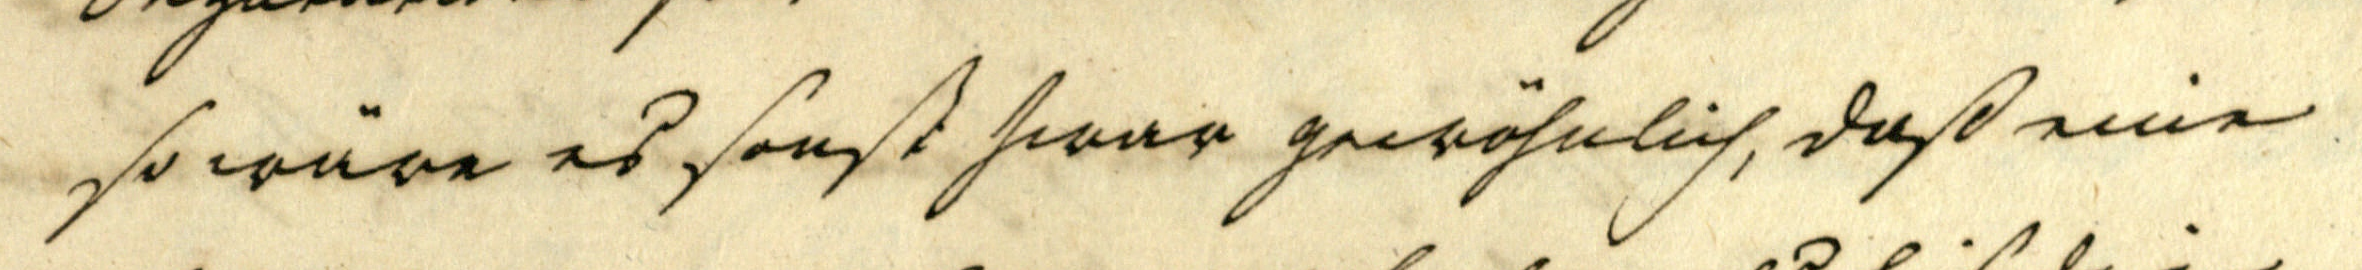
so wäre es sonst zwar gewöhnlich, daß eine
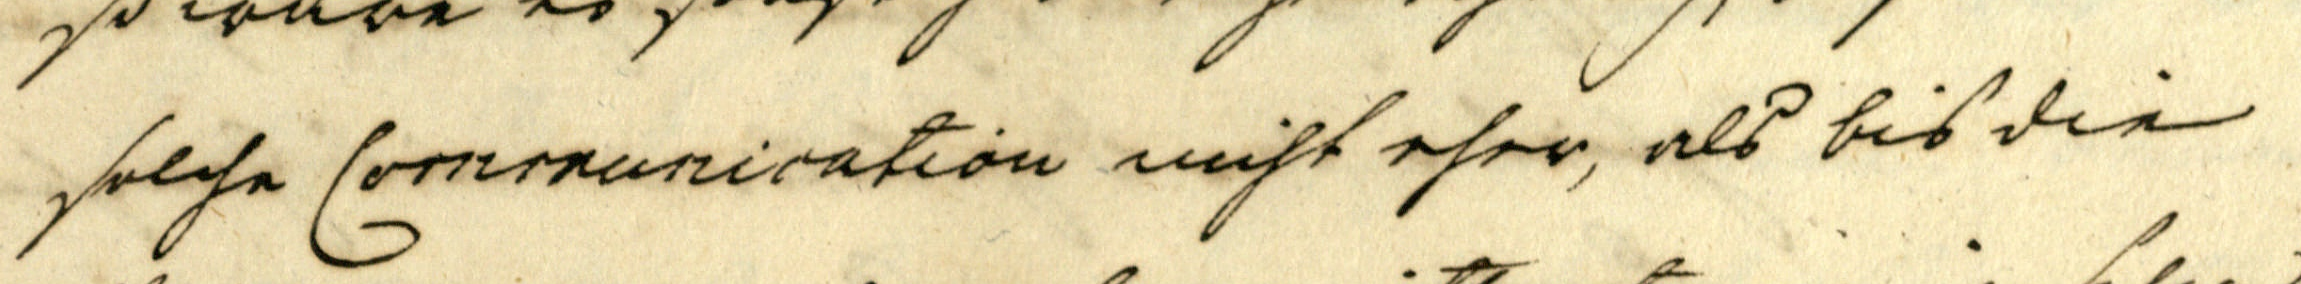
solche Communication nicht eher, als bis die
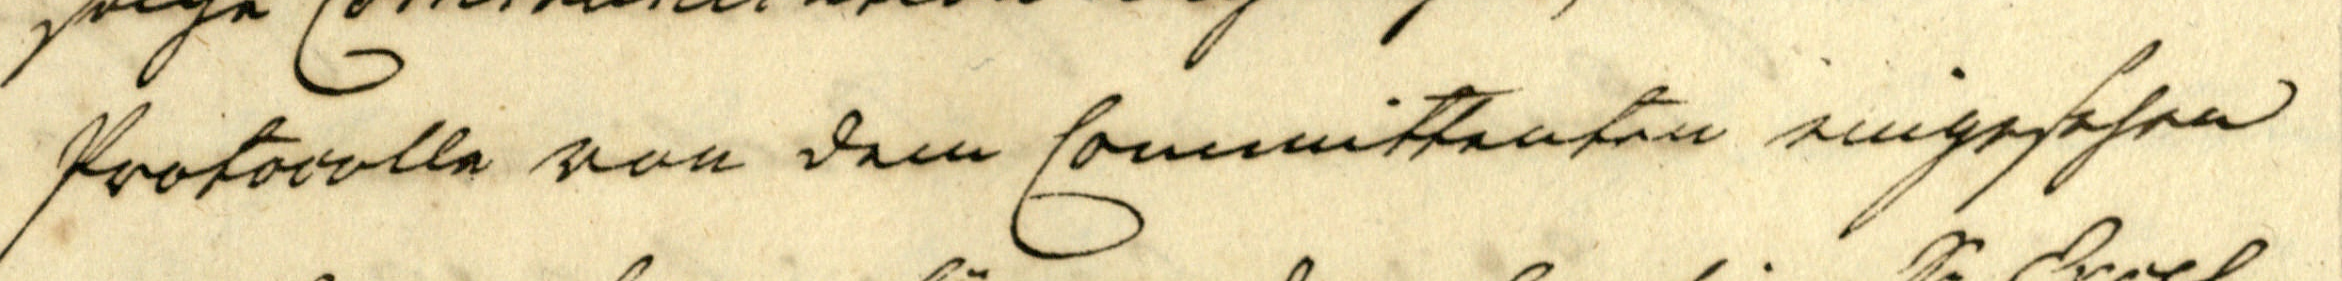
Protocolle von dem Committenten eingesehen
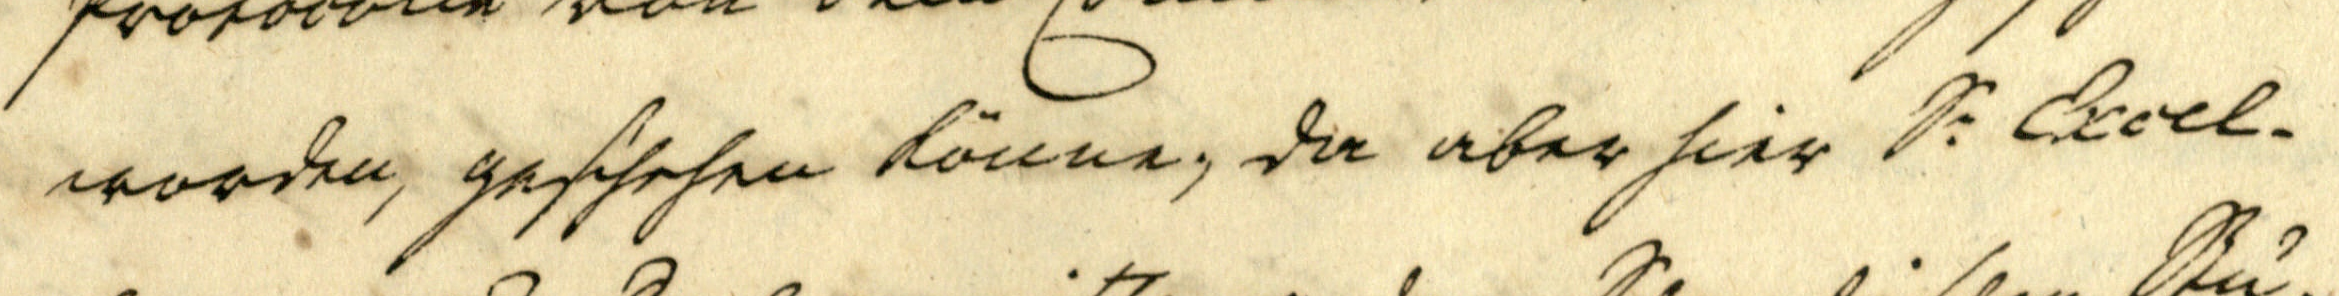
worden, geschehen könne; da aber hier Sr. Excel¬
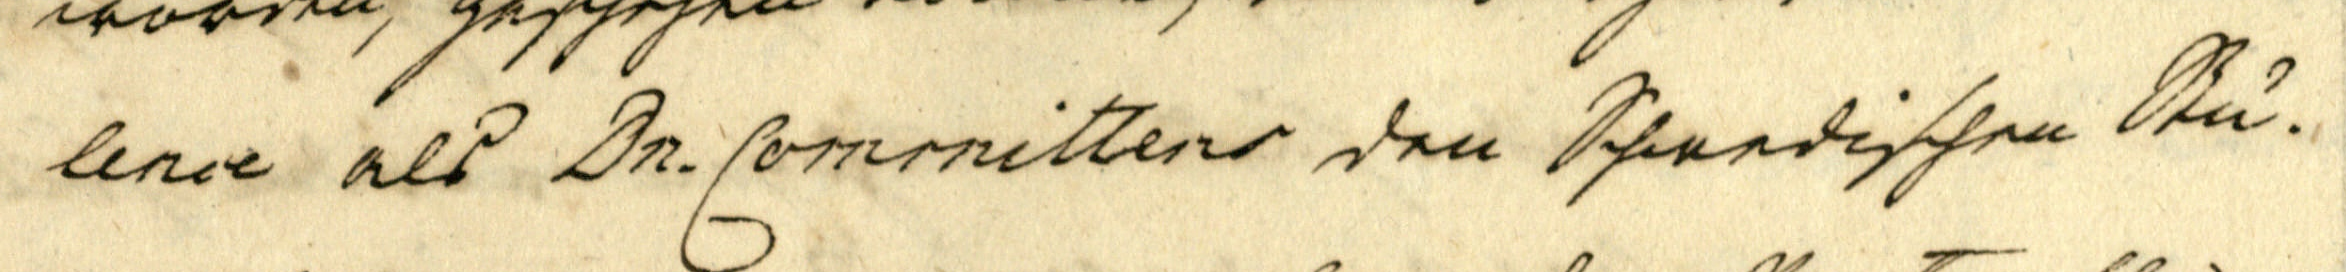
lence als Dn. Commitlens den Schwedischen Stu¬
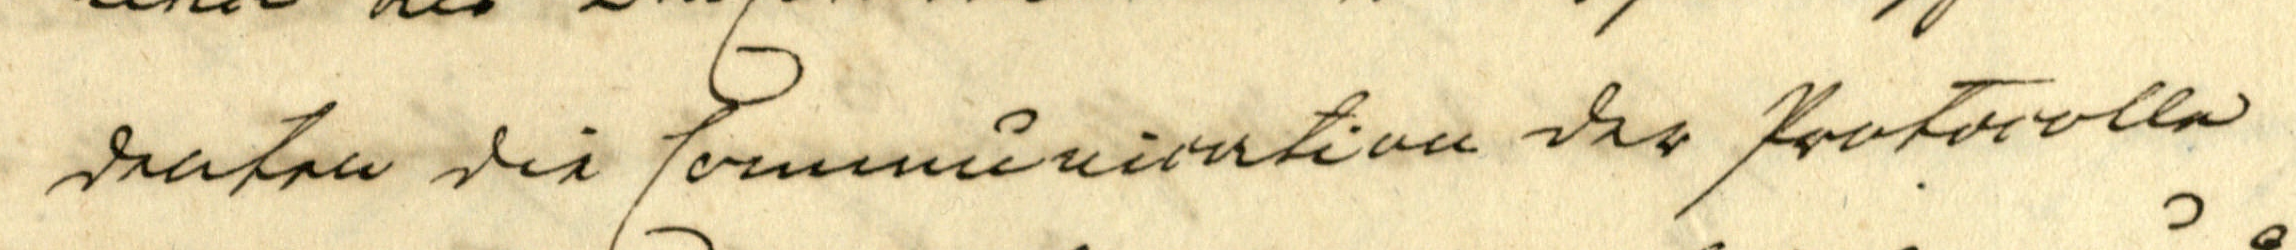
denten die Communication der Protocolle
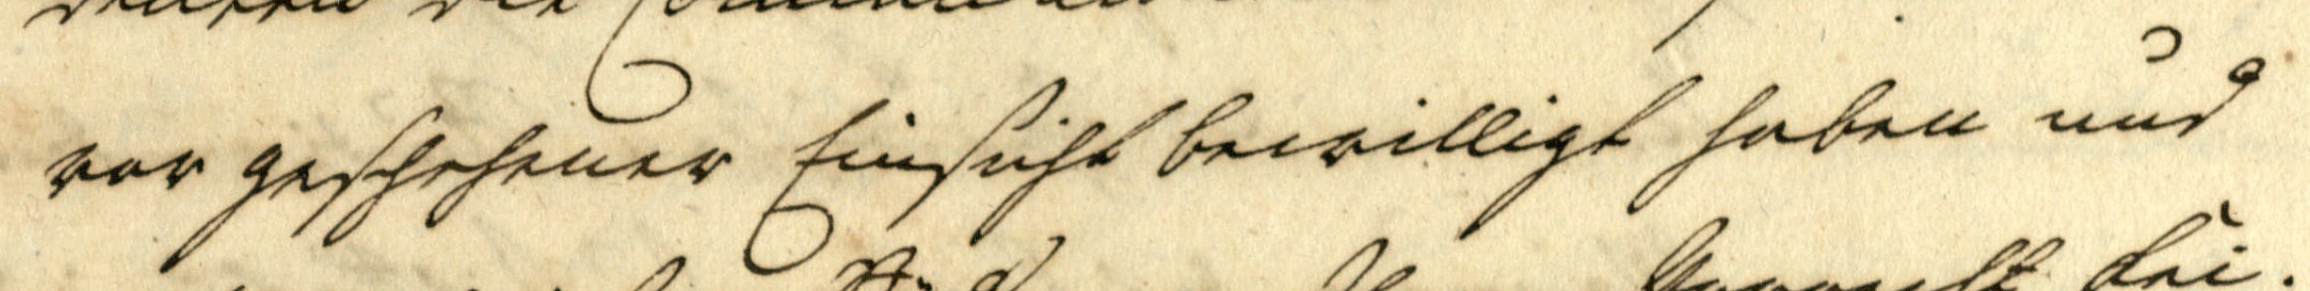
vor geschehener Einsicht bewilligt haben und
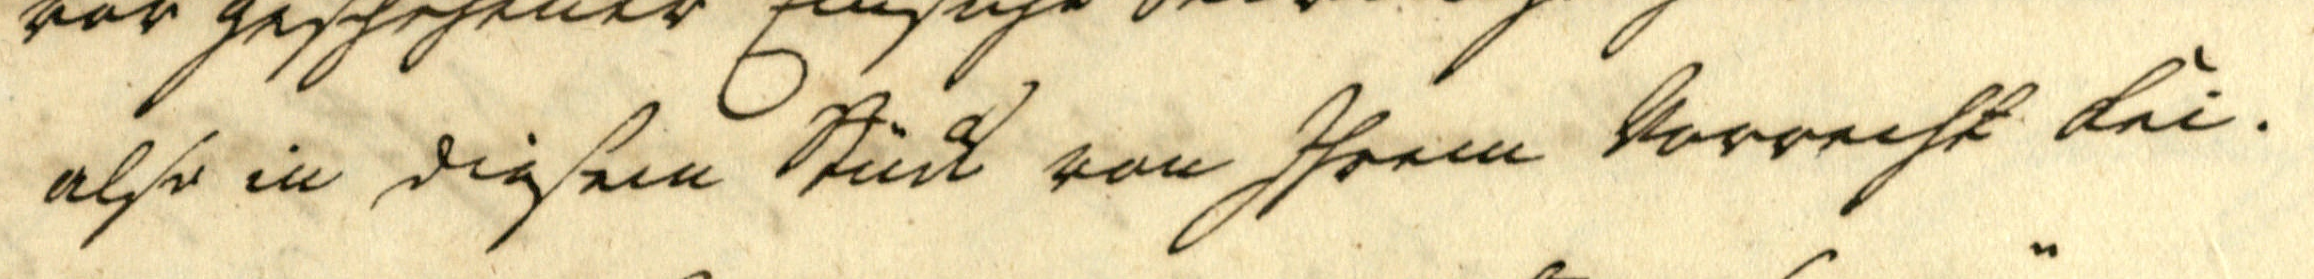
also in diesem Stück von Ihrem Vorrecht kei¬
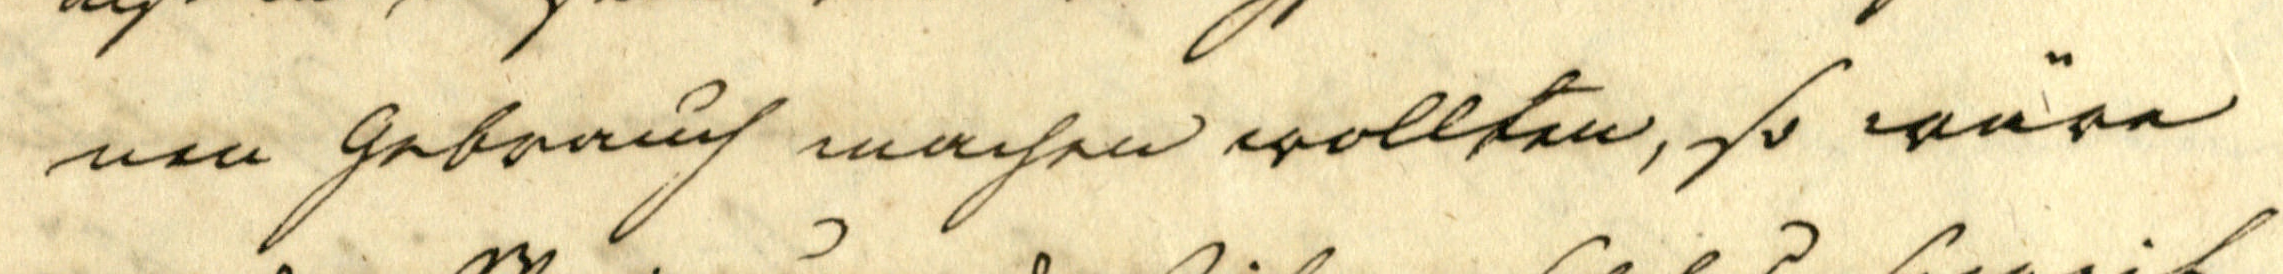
nen Gebrauch machen wollten, so wäre
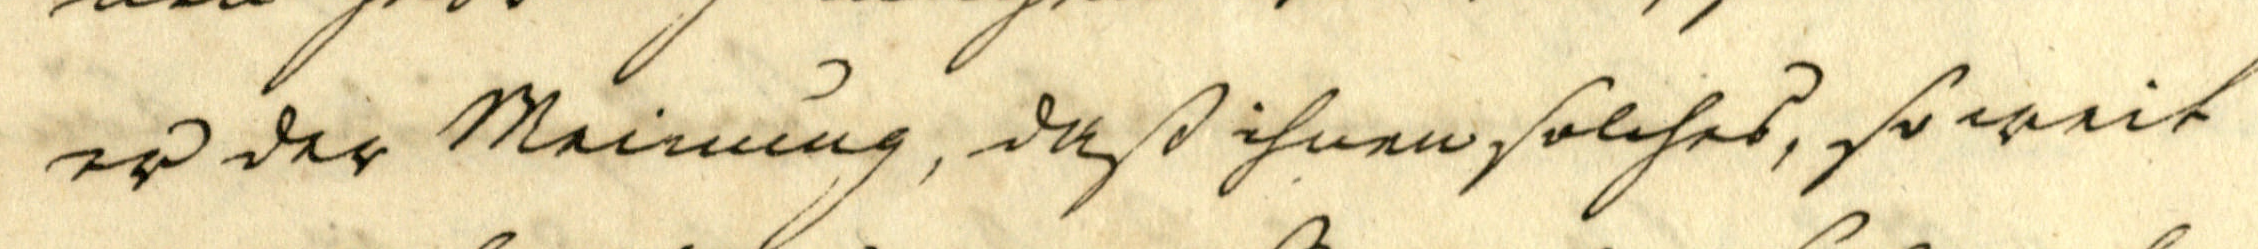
er der Meinung, daß ihnen solches, so weit
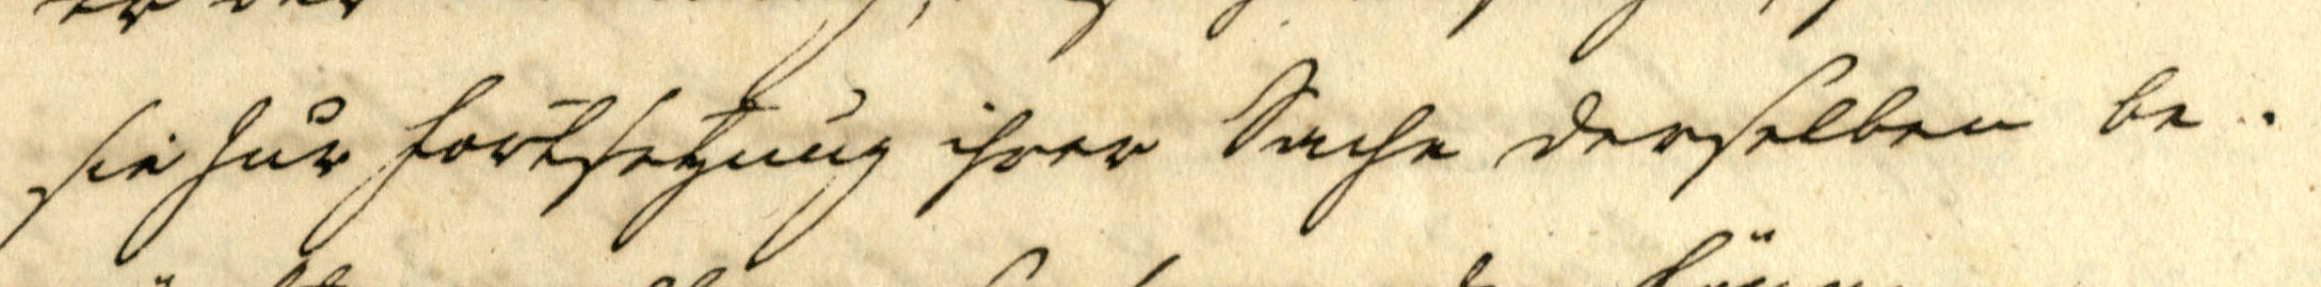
sie zur Fortsetzung ihrer Sache derselben be¬
